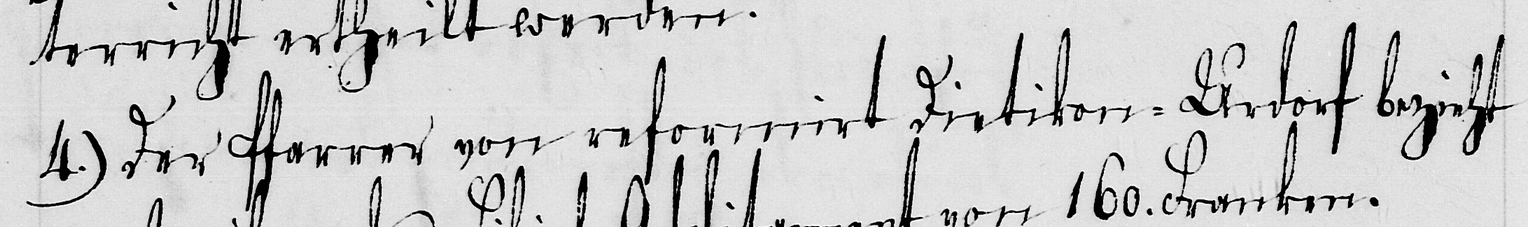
4.) Der Pfarrer von reformirt Dietikon-Urdorf bezieht
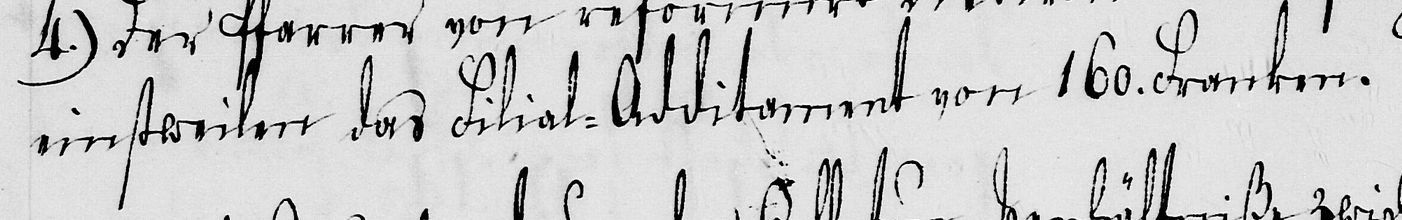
einstweilen das Filial-Additament von 160. Franken.
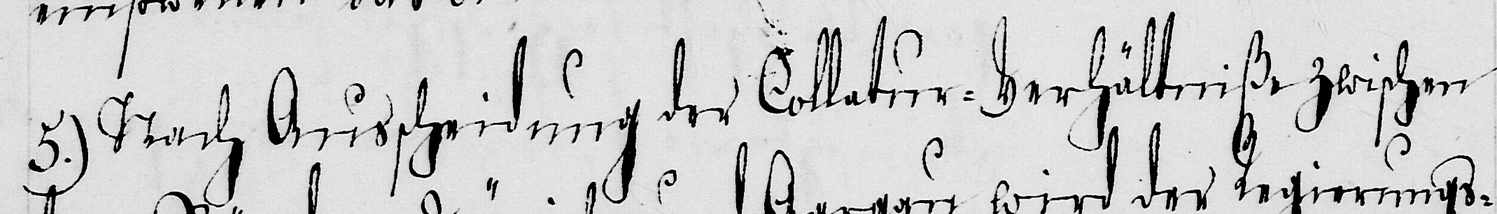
5.) Nach Ausscheidung der Collatur-Verhältniße zwischen
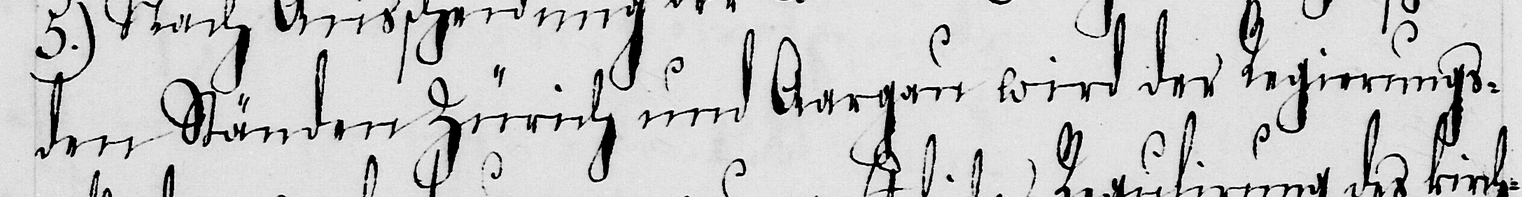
den Ständen Zürich und Aargau wird der Regierungs¬
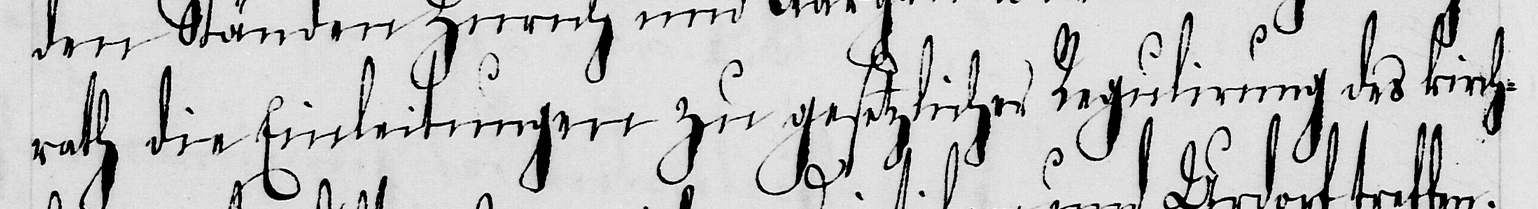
rath die Einleitungen zu gesetzlicher Regulirung des kirch¬
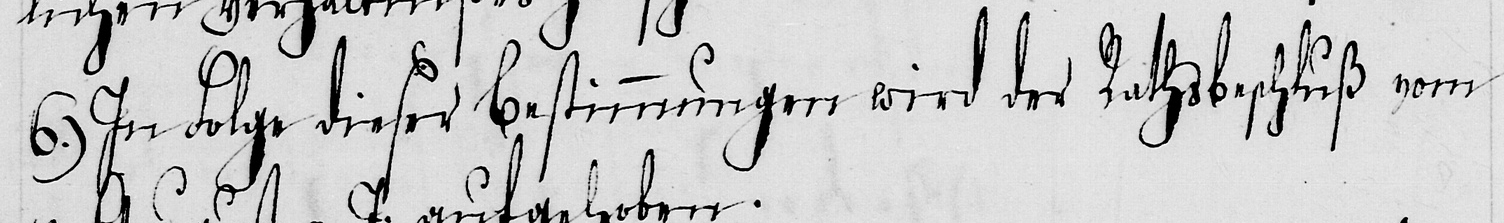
6.) In Folge dieser Bestimmungen wird der Rathsbeschluß vom
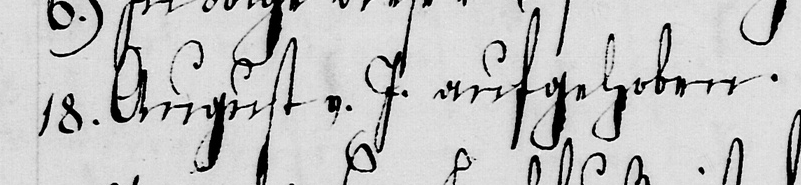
18. August v. J. aufgehoben.
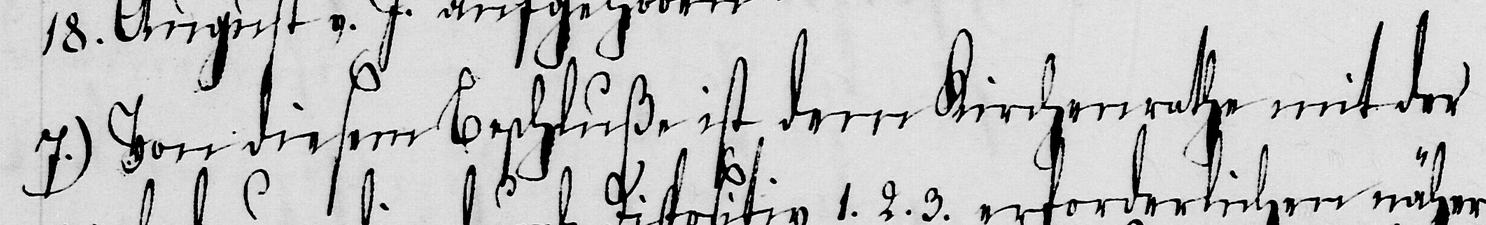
7.) Von diesem Beschluße ist dem Kirchenrathe mit der
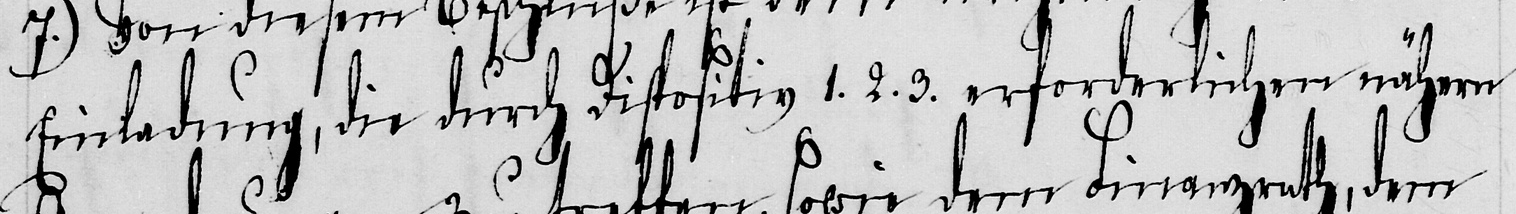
Einladung, die durch Dispositiv 1. 2. 3. erforderlichen
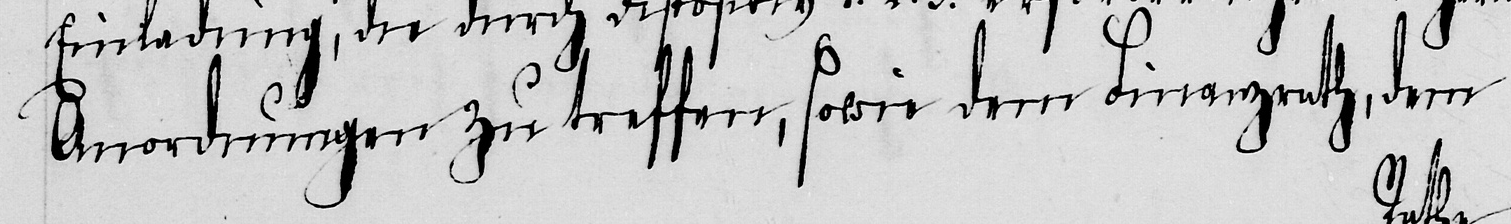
Anordnungen zu treffen, sowie dem Finanzrath, dem
